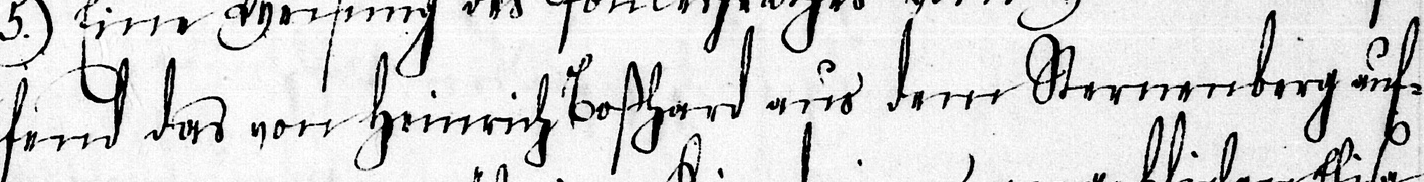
fend das von Heinrich Boßhard aus dem Sternenberg auf¬
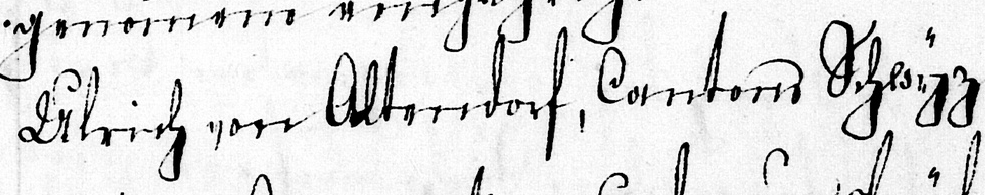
Ulrich von Altendorf, Cantons Schwyz.
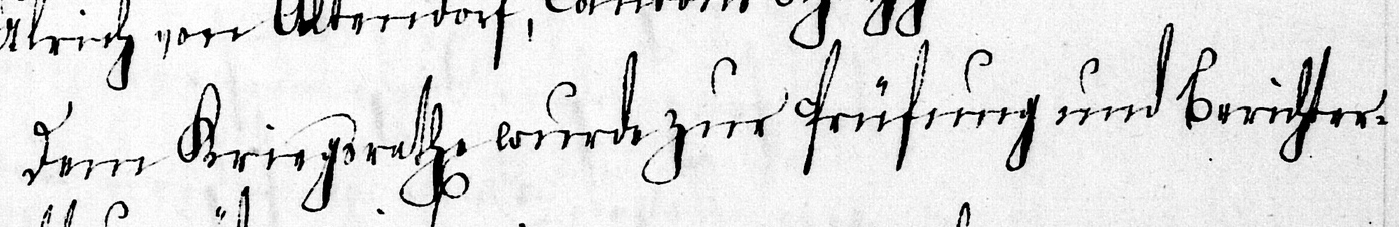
Dem Kriegsrathe wurde zur Prüfung und Berichtser¬
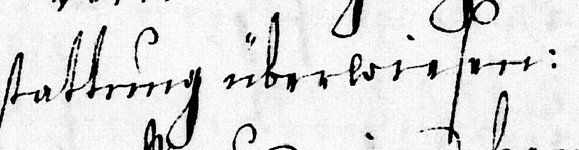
stattung überwiesen:
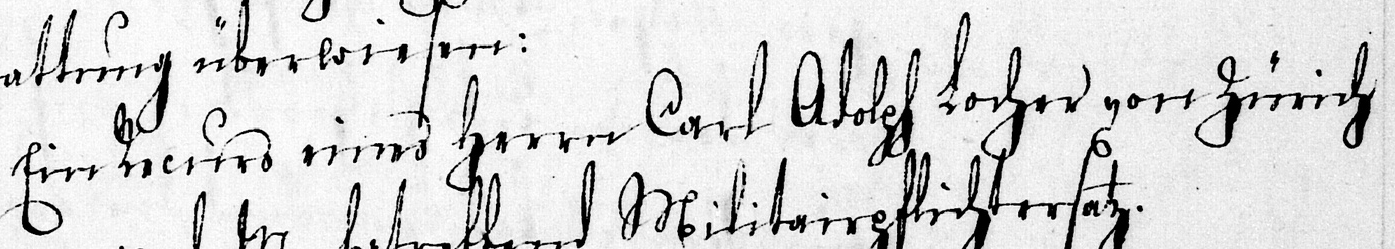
Ein Recurs eines Herrn Carl Adolph Locher von Zürich
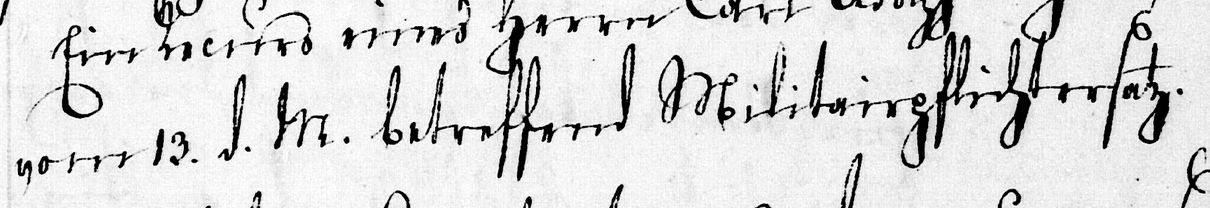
vom 13. d. M. betreffend Militairpflichtersatz.
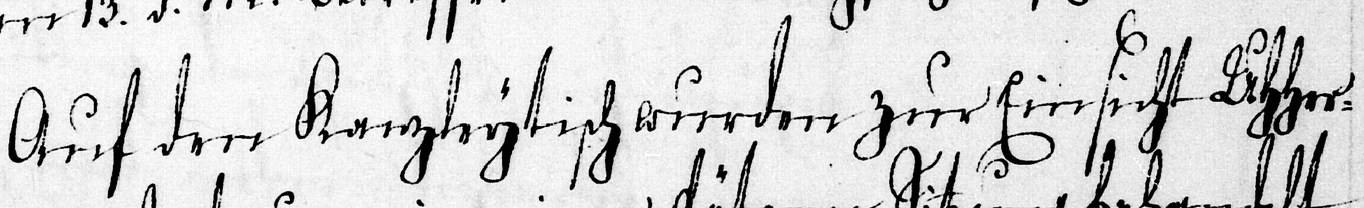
Auf den Kanzleytisch wurden zur Einsicht UHHer¬
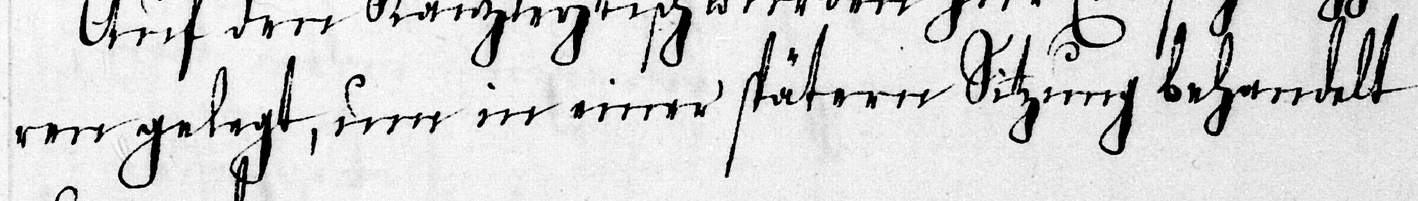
ren gelegt, um in einer spätern Sitzung behandelt
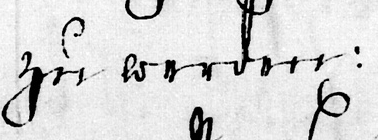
zu werden:
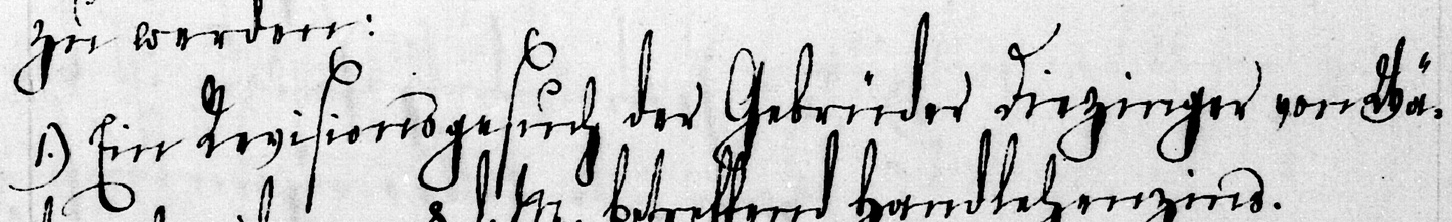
1.) Ein Revisionsgesuch der Gebrüder Diezinger von Wä¬
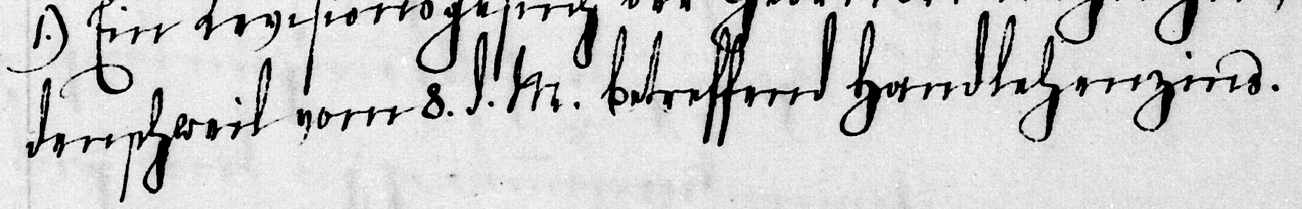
denschweil vom 8. d. M. betreffend Handlehenzins.
